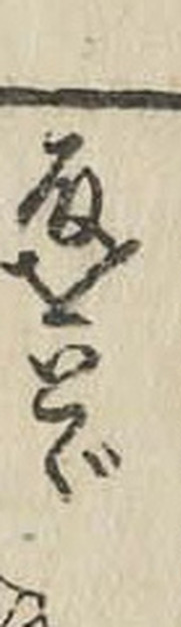殿をとゞ
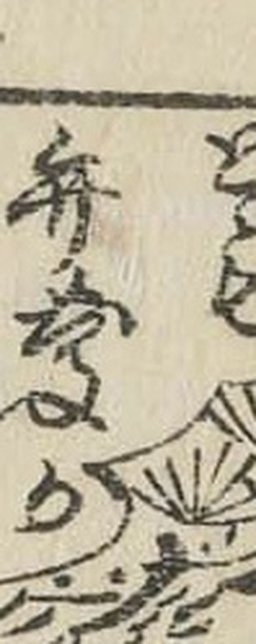弁慶か
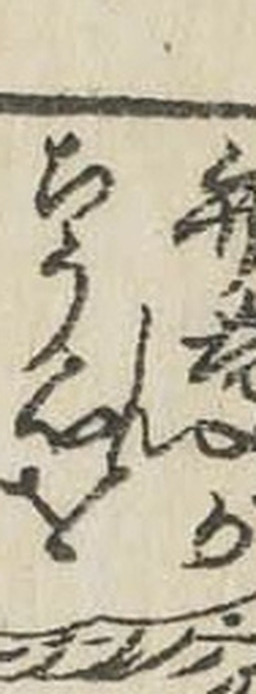ちう心を
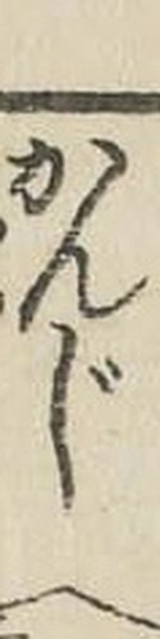かんじ

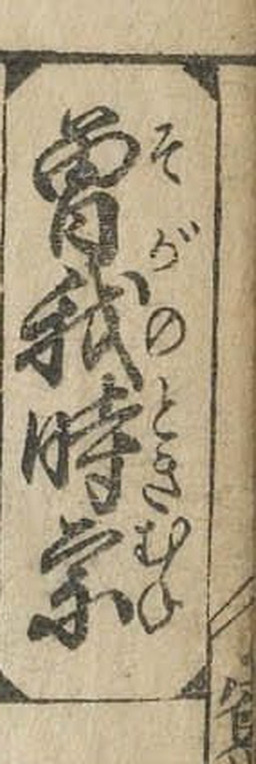曽我時宗
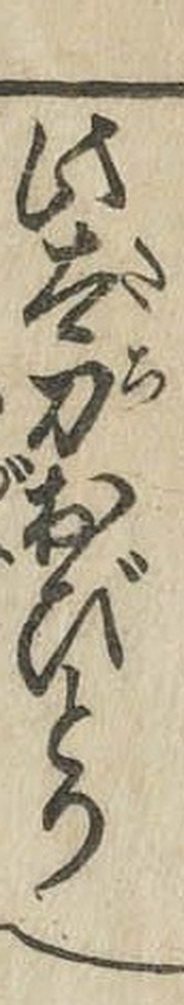此太刀おびとり
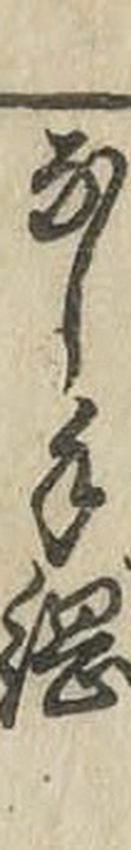なし手綱
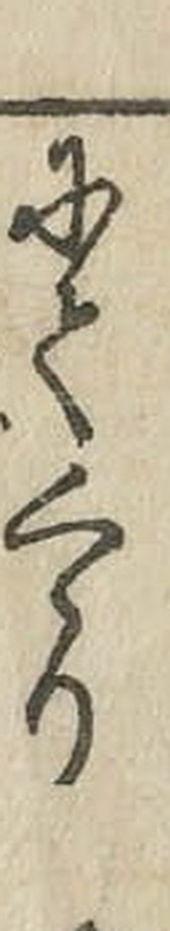にてくゝり
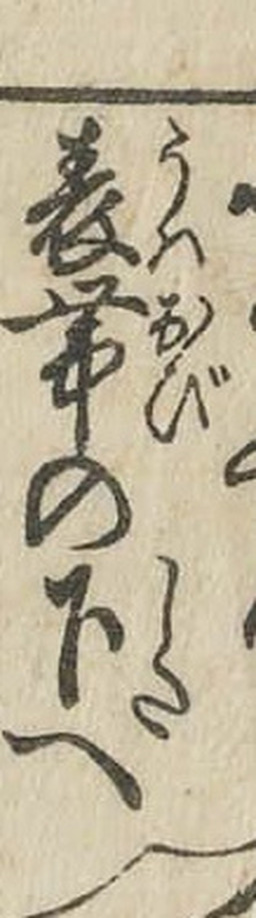表帯の下へ
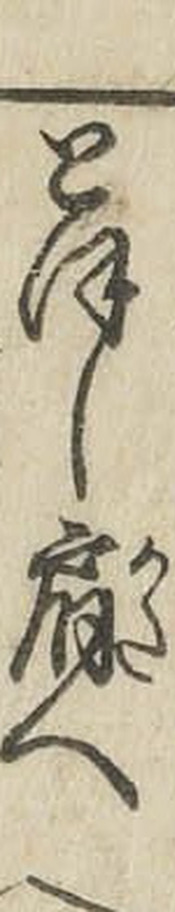とほし肩へ
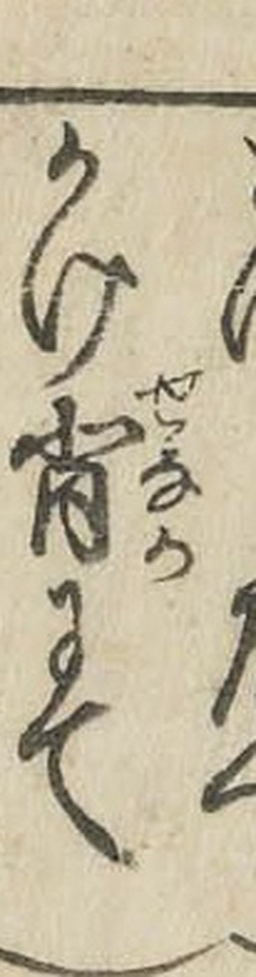かけ背にて
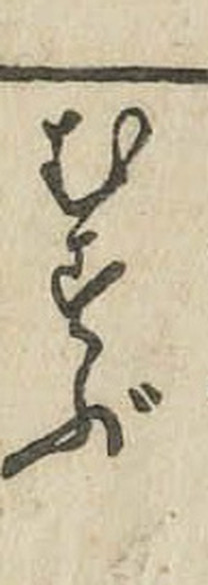むすぶ
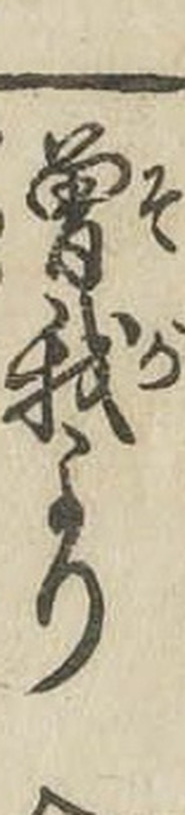曽我より
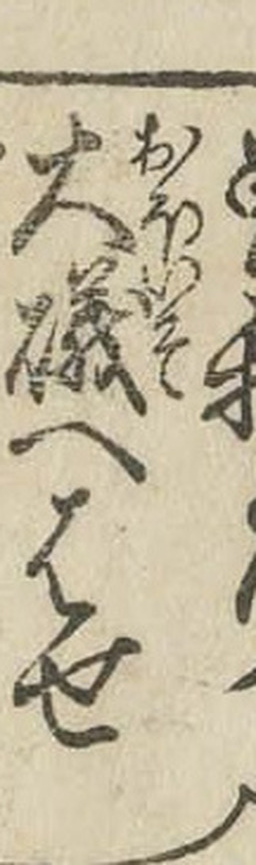大礒へはせ
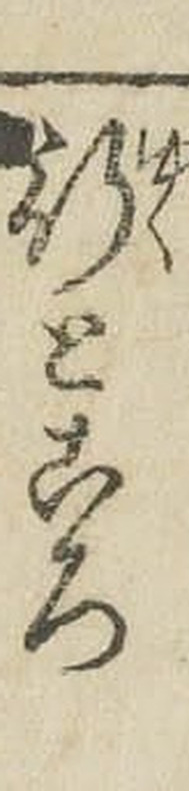行ところ
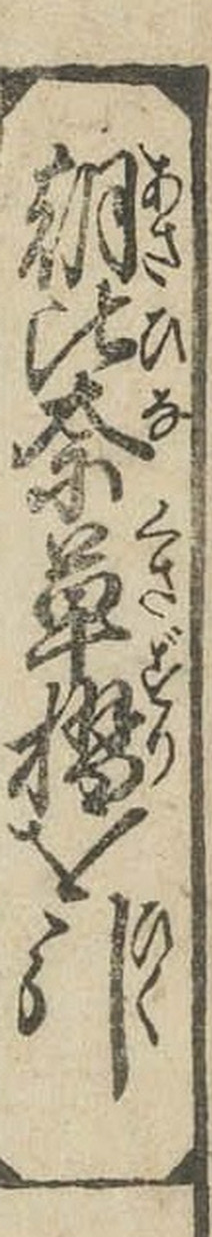朝比奈草摺を引
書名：絵本写宝袋 9巻 3之巻
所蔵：東京学芸大学教育コンテンツアーカイブ
